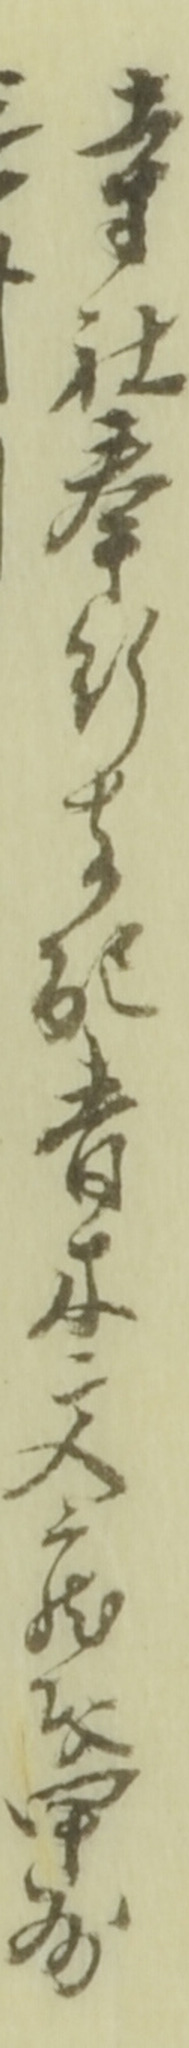寺社奉行支配青木文蔵者甲州
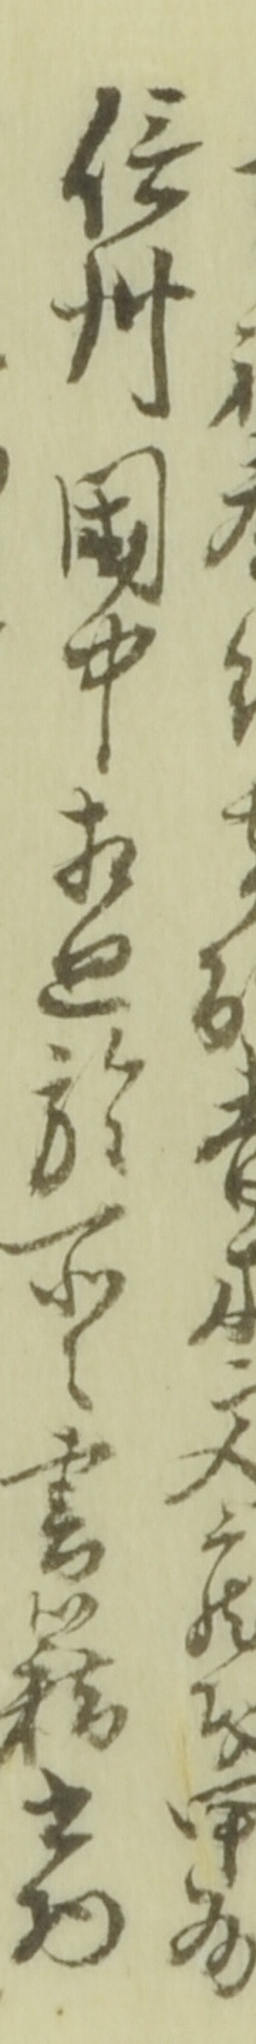信州国中相廻於所々書籍書物
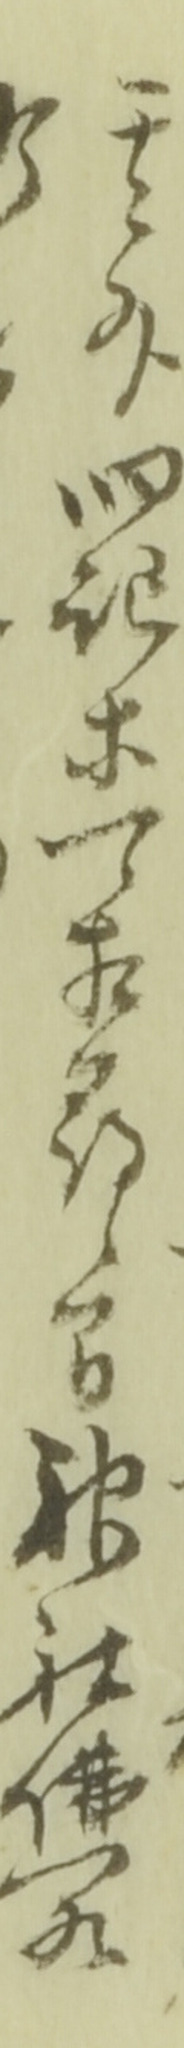其外四経等可相尋候間神社佛閣
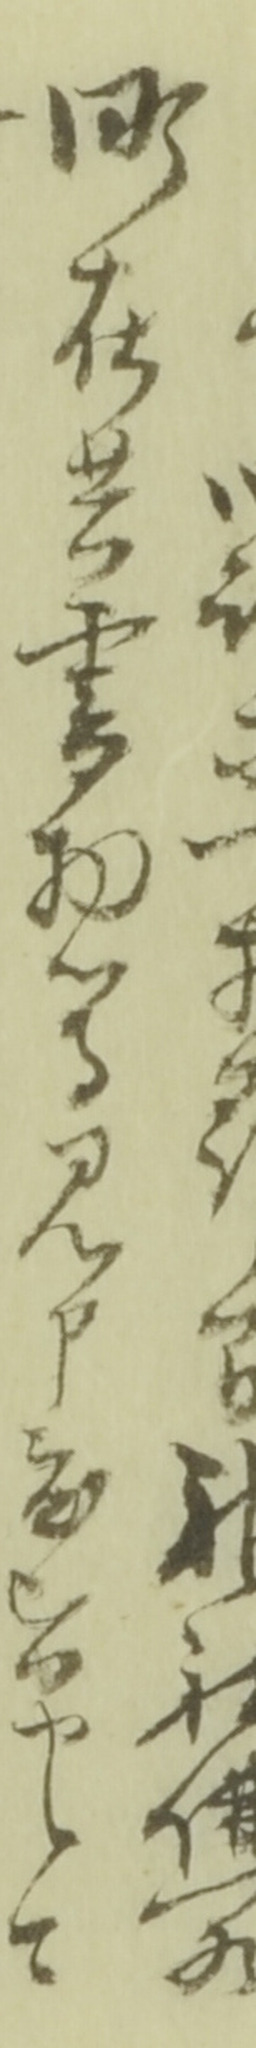町在芸書物等見申度旨申候て
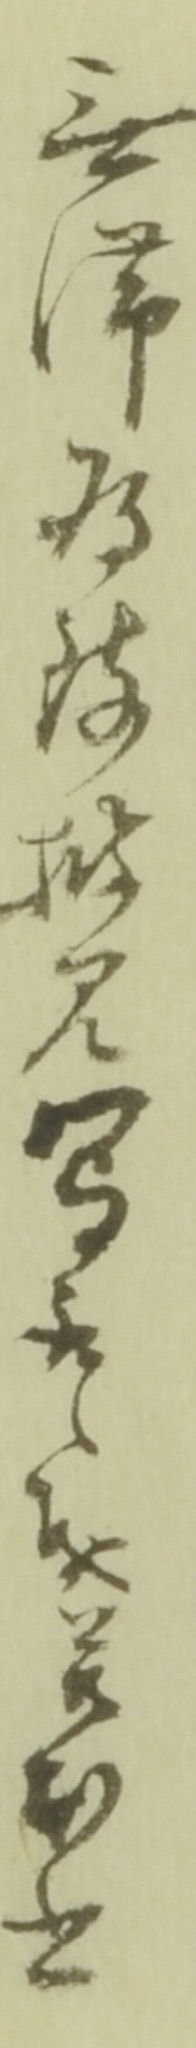無滞為致披見写取候義並出書く
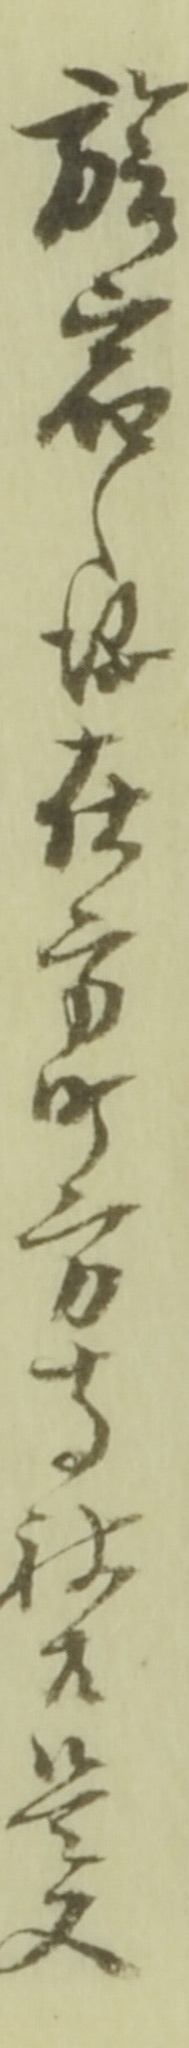族宿候様在方町方寺社共是又
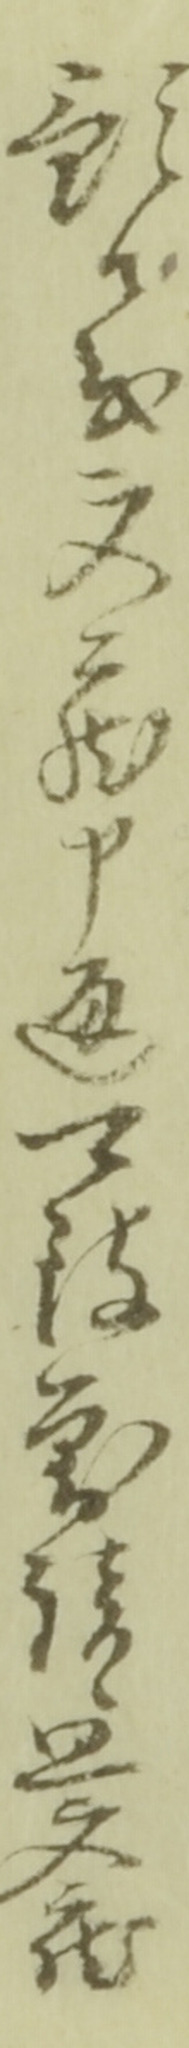願候義文蔵申通可致勘請候且文蔵
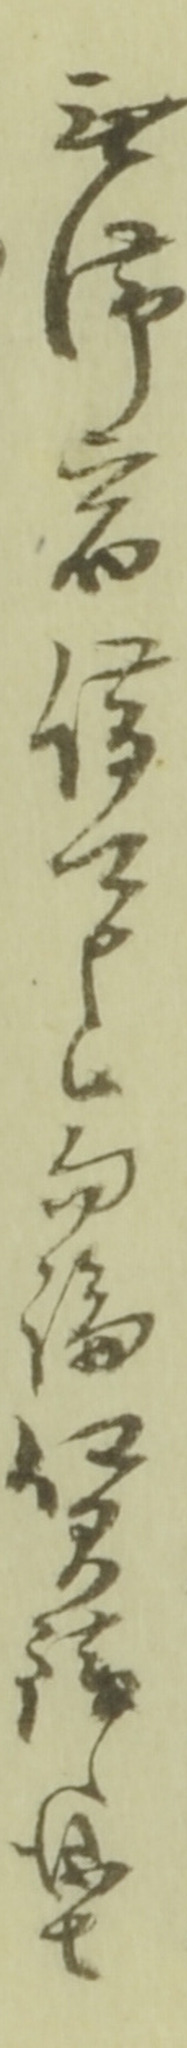無滞宿停め可申候勿論賃銀之儀者
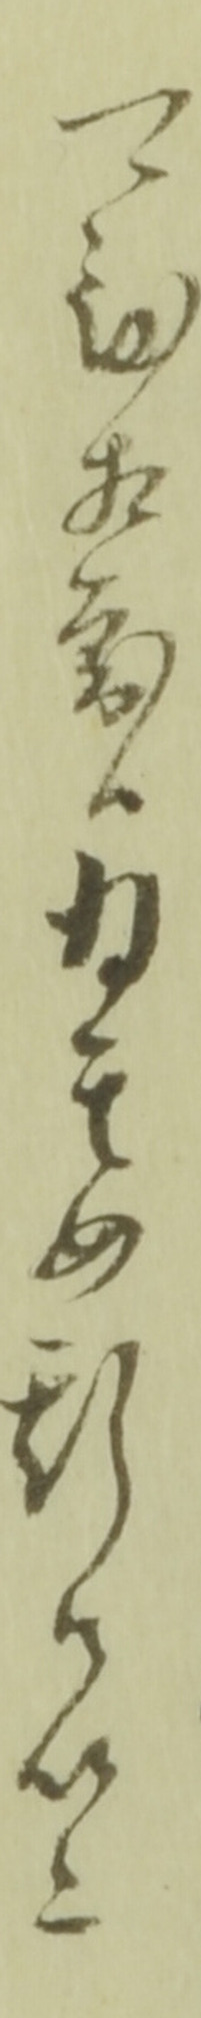可置相触候為其如斯候以上
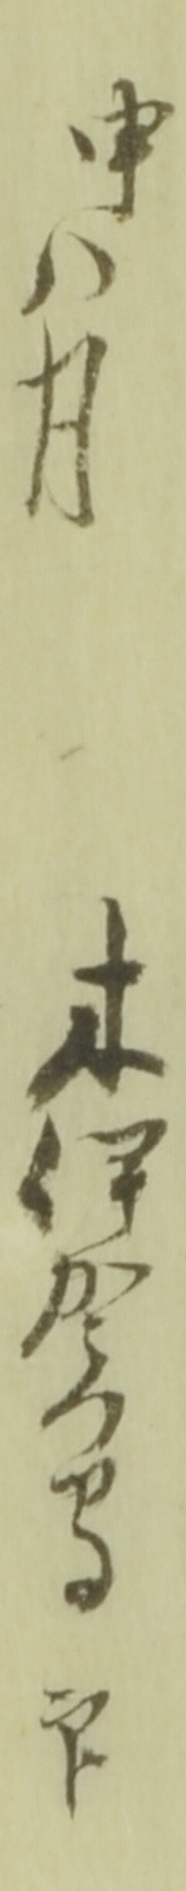申八月木伊賀守印
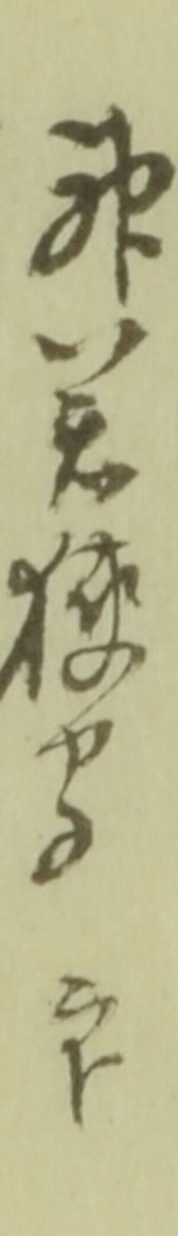神若狭守印
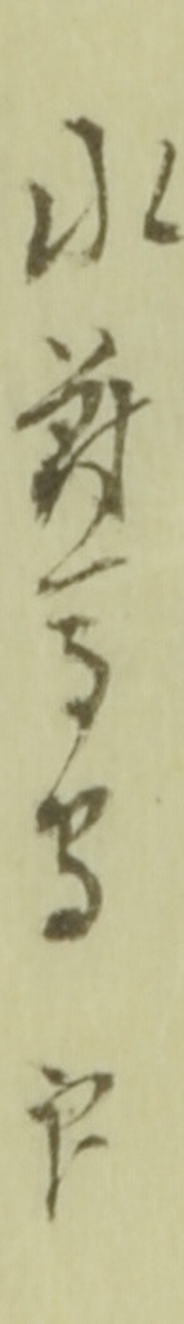水対馬守印
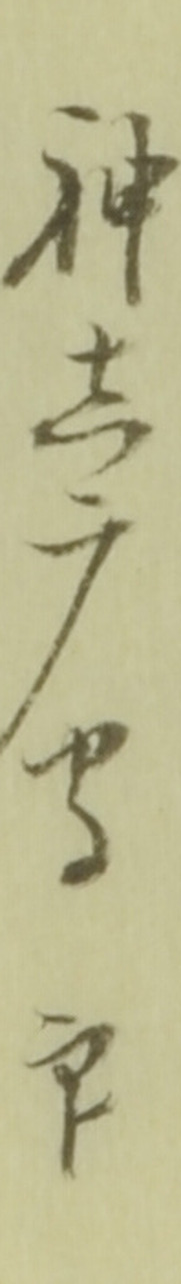神志摩守印
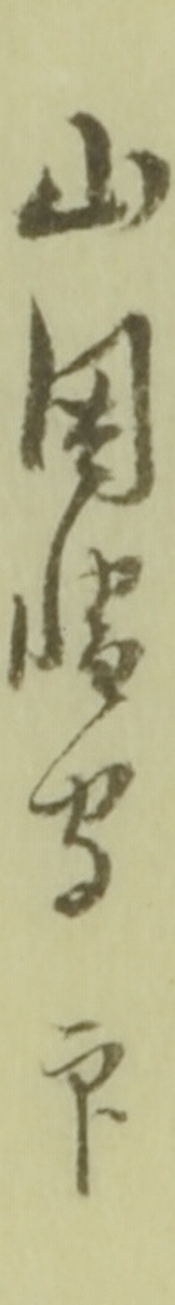山因幡守印
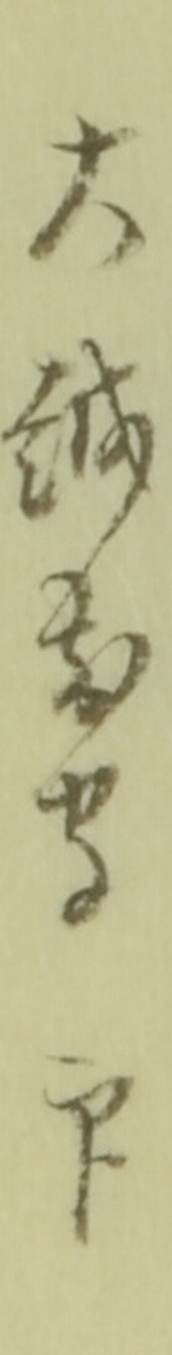大越前守印
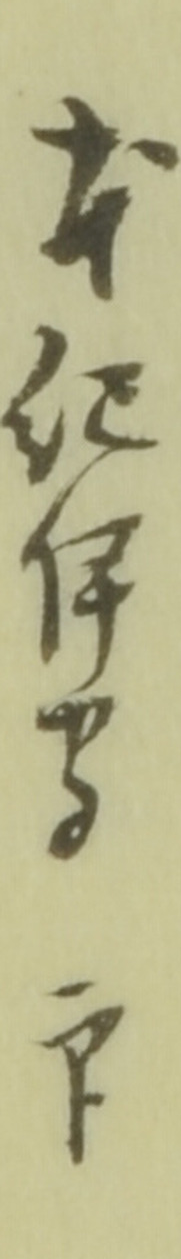本紀伊守印
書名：御公儀様御領主様御触書控
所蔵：伊那市立高遠町図書館・合同会社AMANE
